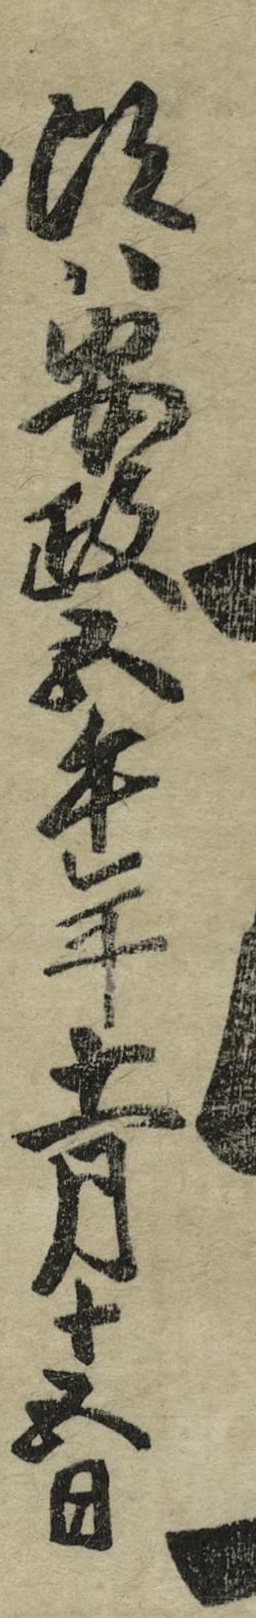頃は安政五年十一月十五日
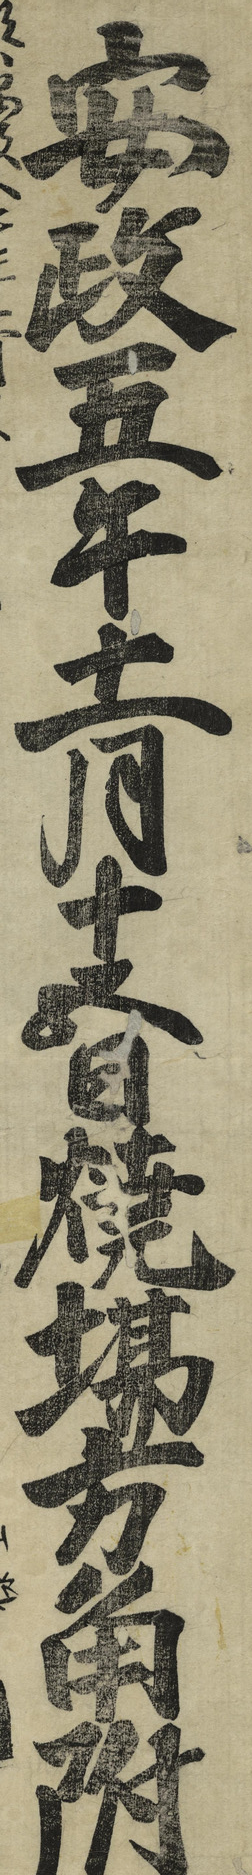安政五午十一月十五日焼場方角附
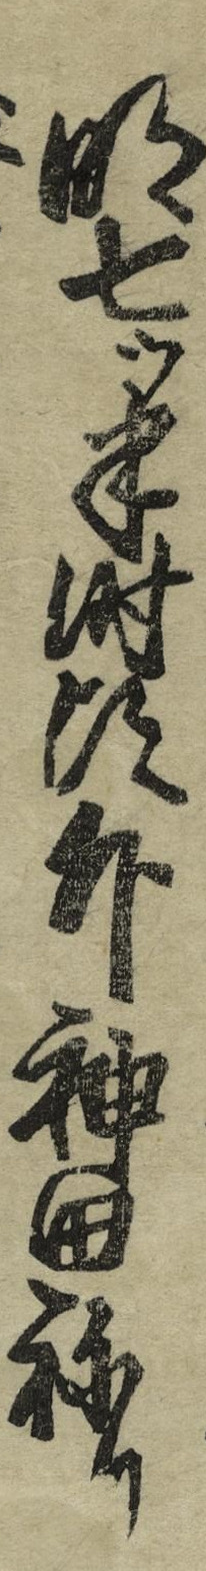明七ッ半時頃外神田ねり
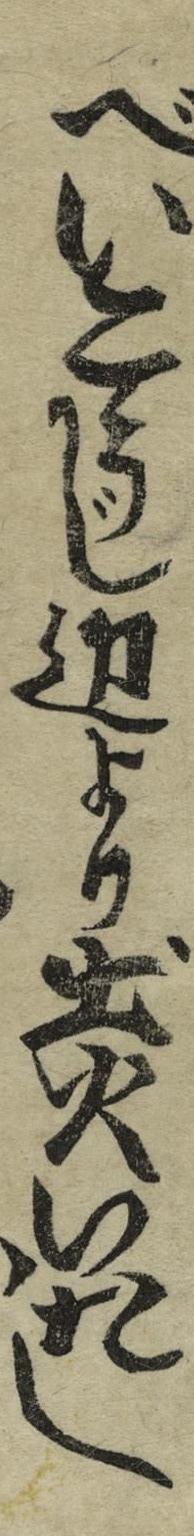べいこうじ辺より出火いたし
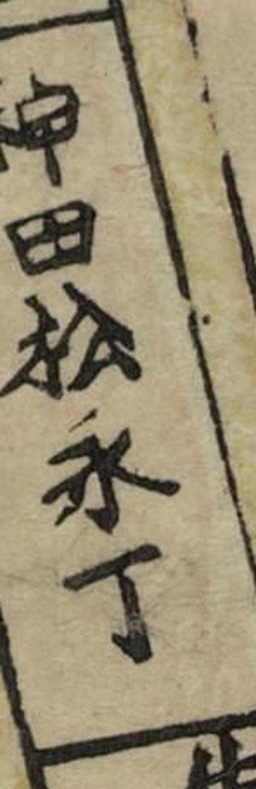神田山本丁
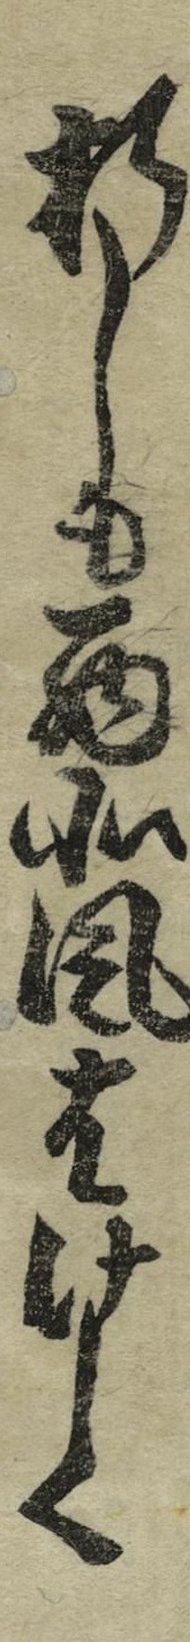折しも西北風はけしく
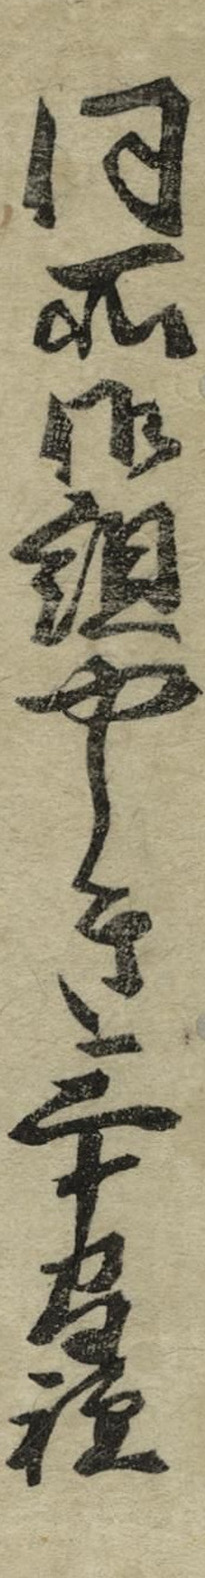同所御組やしき三十間程
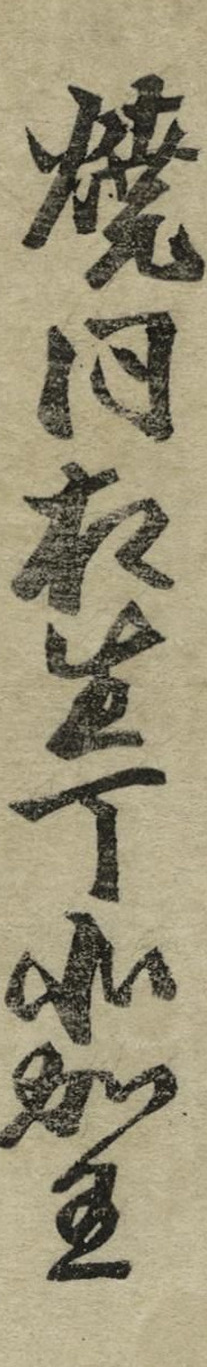焼同相生丁北かわ
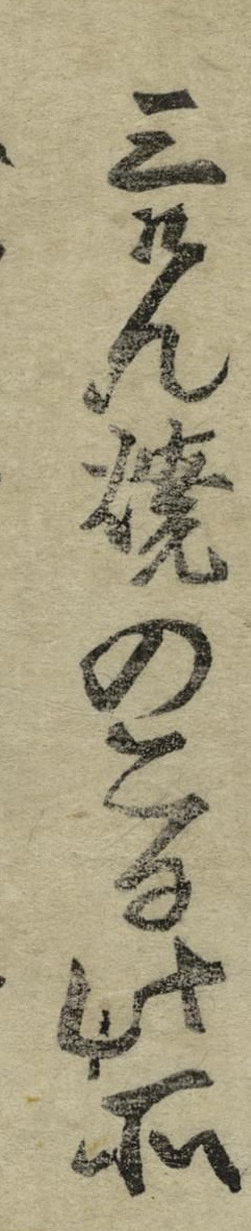三けん焼のこる此所
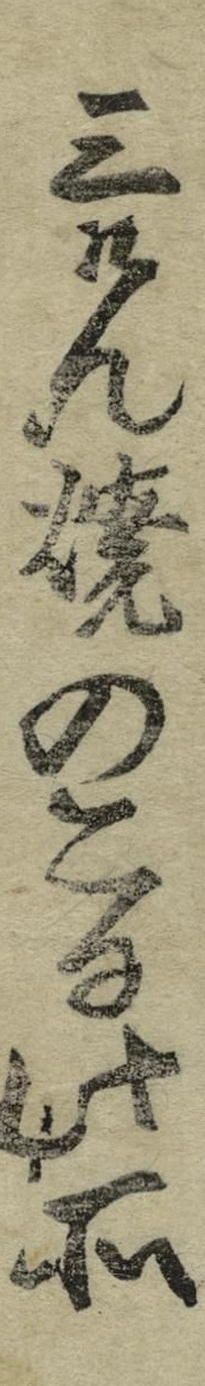三けん焼のこる此所
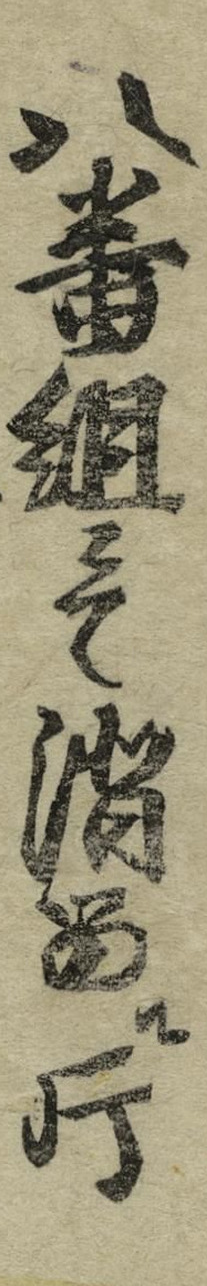八番組にて消留ル片
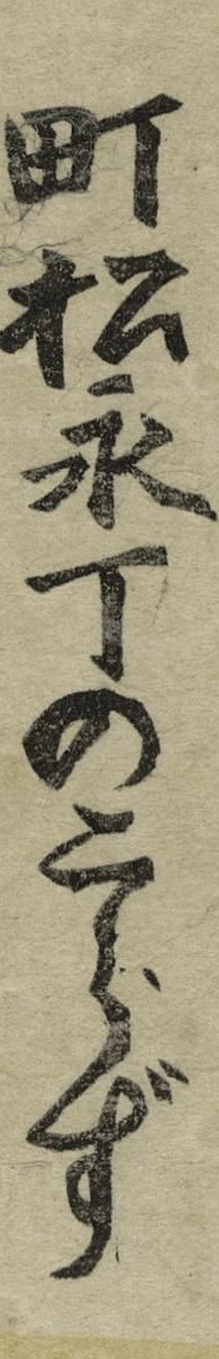町松永丁のこらず
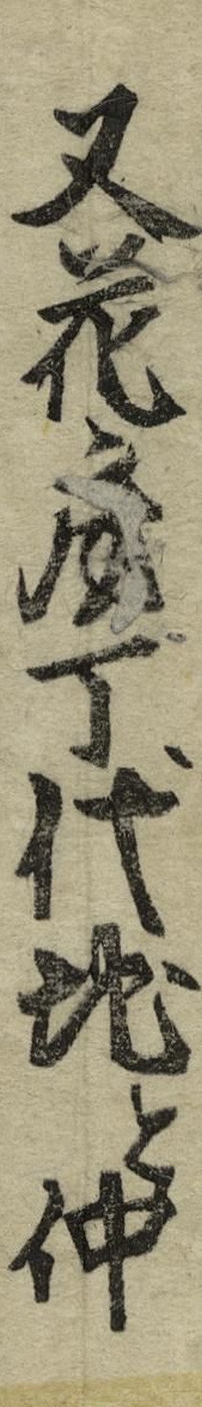又花房丁代地と仲
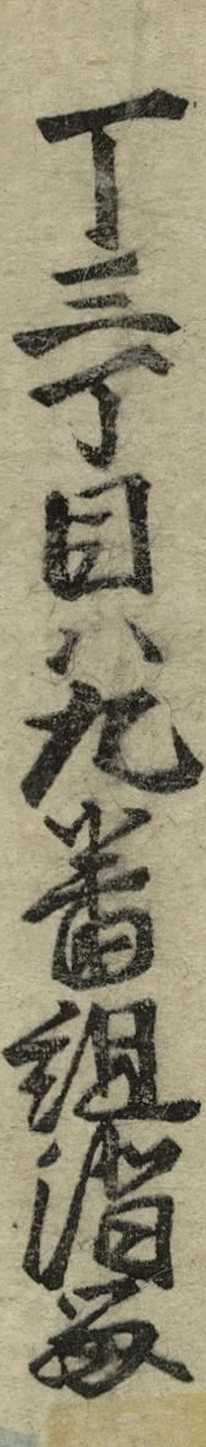丁三丁は九番組消留
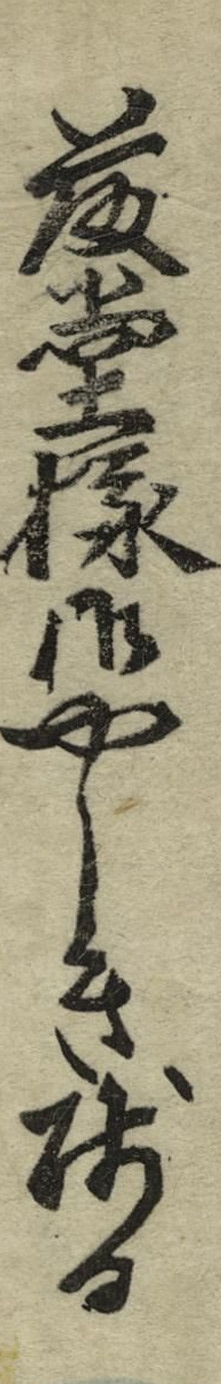藤堂様御やしき残る
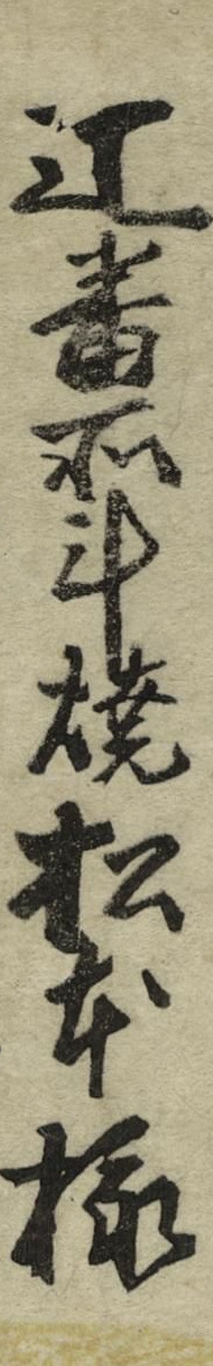辻番所斗焼松本様
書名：安政五午十一月十五日焼場方角附
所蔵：東京大学地震研究所図書室 Earthquake Research Institute Library, The University of Tokyo, JAPAN
